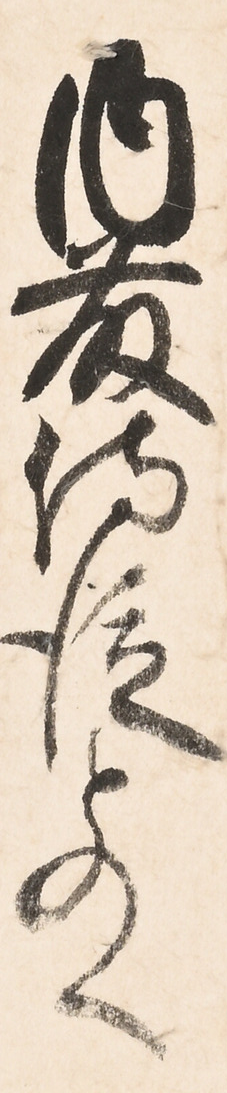内藤侍従とのへ

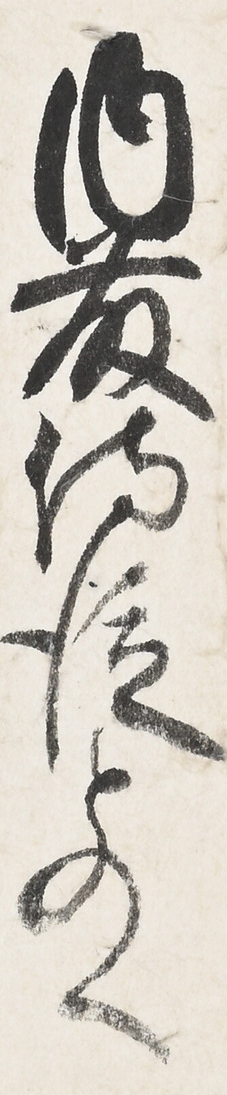内藤侍従とのへ

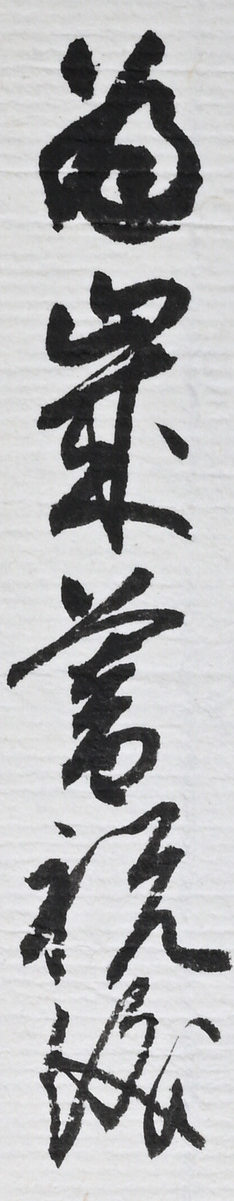為歳暮祝儀
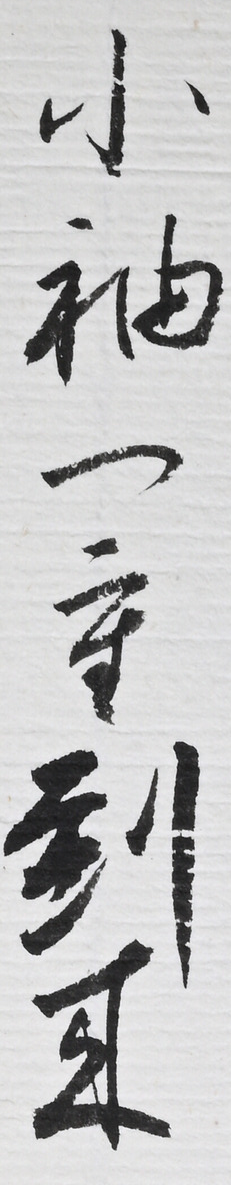小袖一重到来
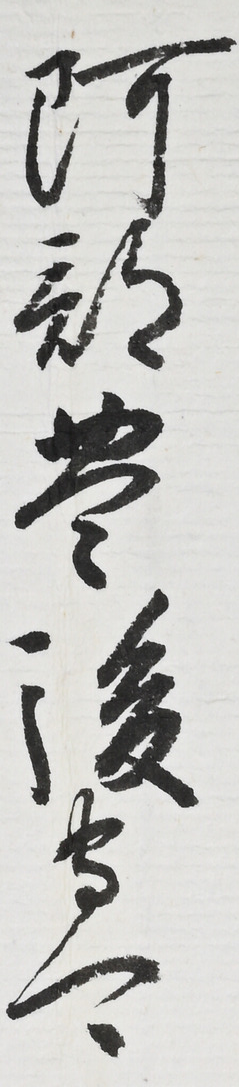阿部豊後守可
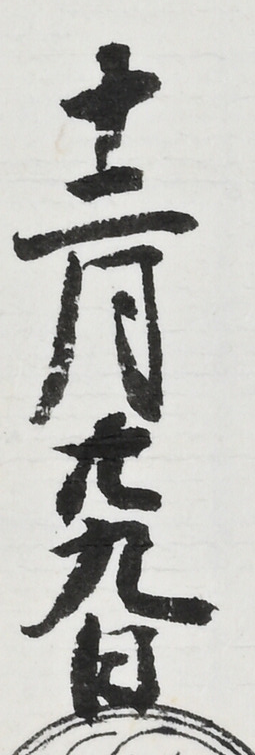十二月廿九日
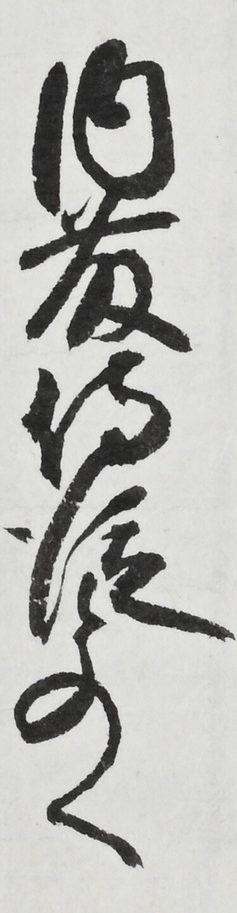内藤侍従とのへ
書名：御内書
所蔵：伊那市立高遠町図書館・合同会社AMANE
